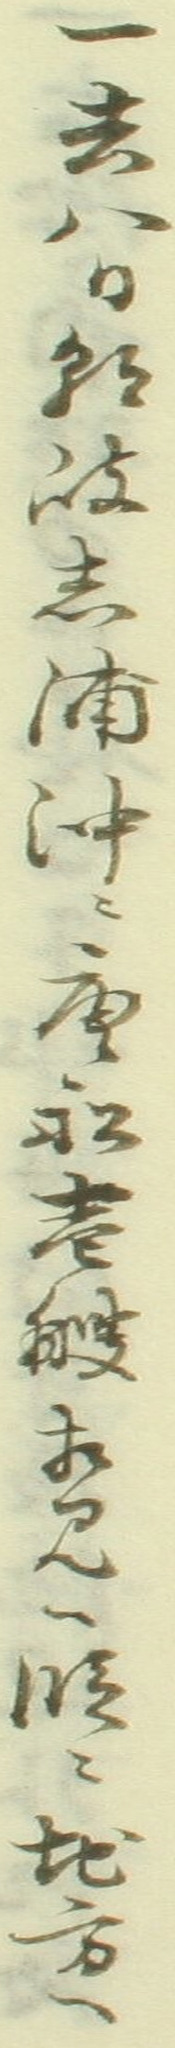一去八日朝岐志浦沖に唐船壱艘相見へ段々地方へ
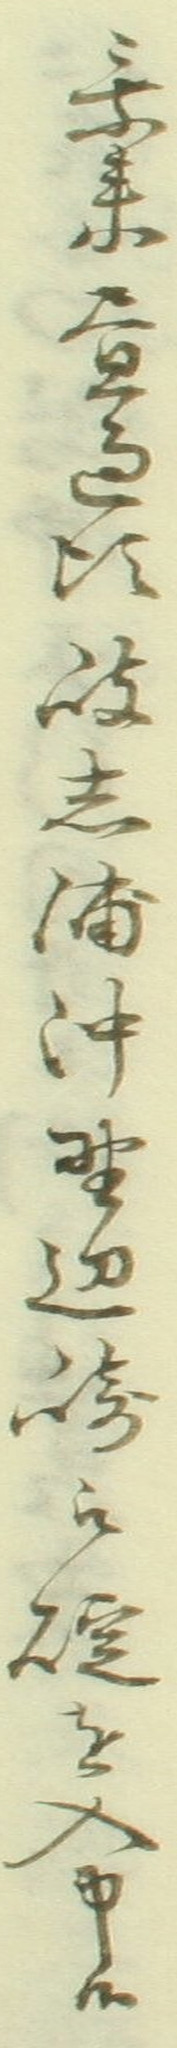乗来昼過頃岐志浦沖野辺崎え碇を入申候
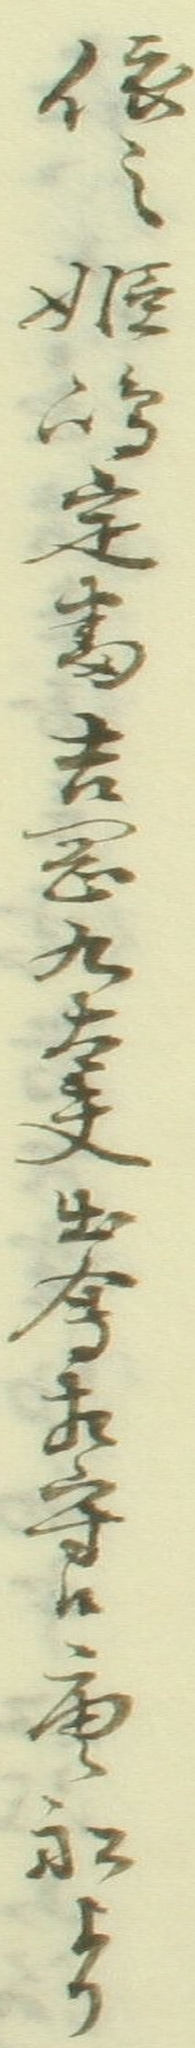依之姫島定番吉岡九太夫出会相守候唐船より
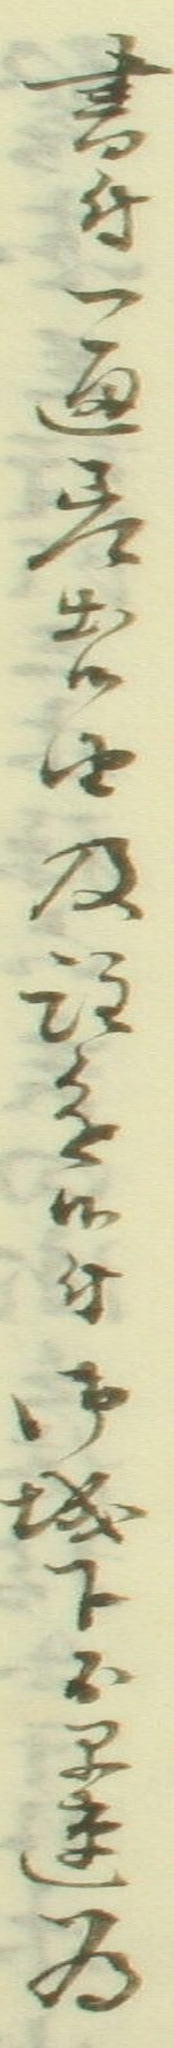書付一通差出候由及注進候付御城下ゟ早速為

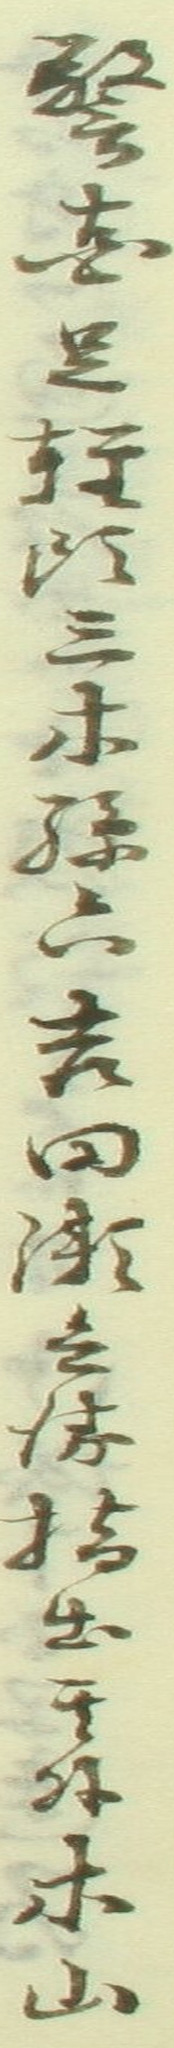警固足軽頭三木孫六吉田清兵衛差出其外木山
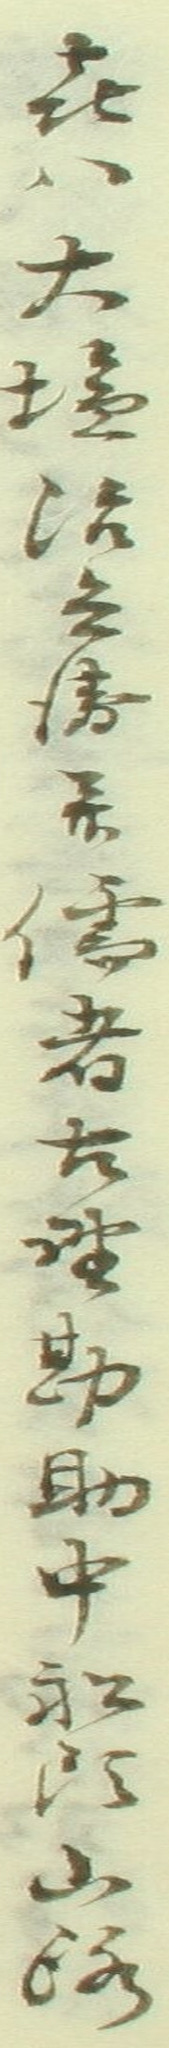喜八大塩治兵衛并儒者古野勘助中船頭山路
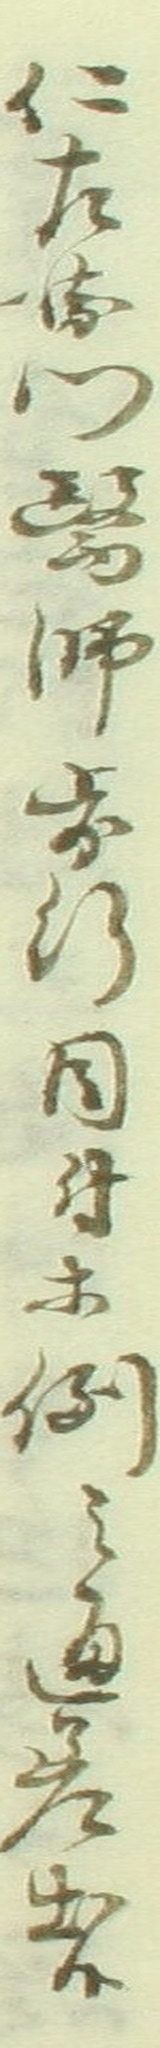仁左衛門医師歩行目付等例之通差出候
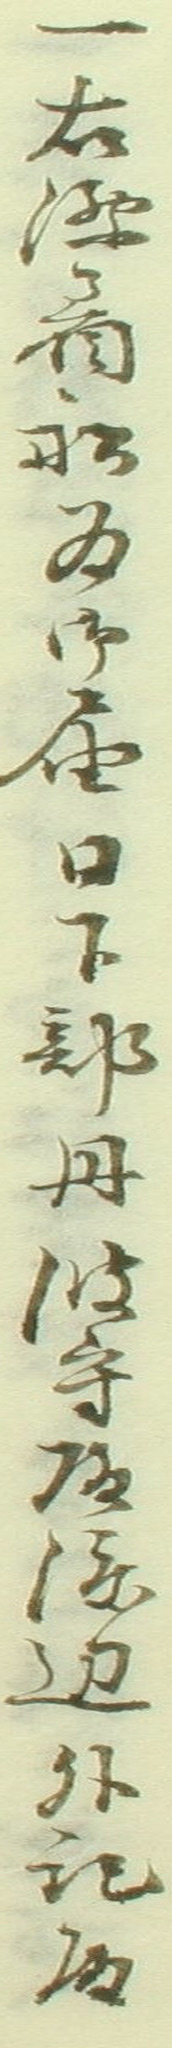一右漂着船為御届日下部丹波守殿渡辺外記殿
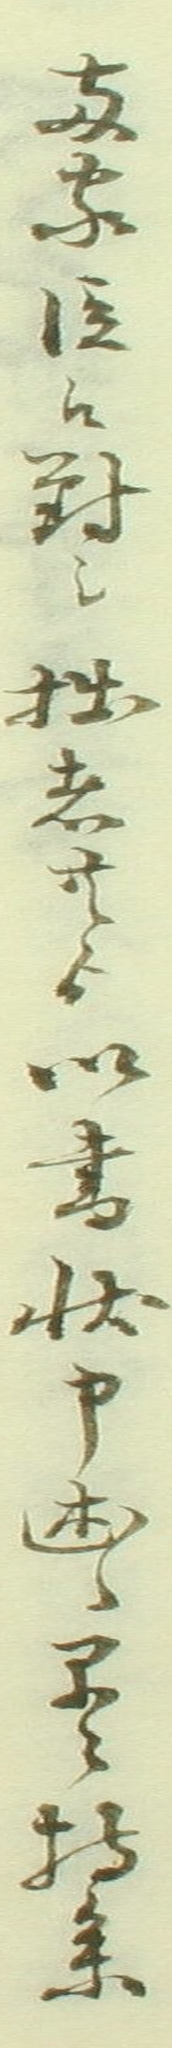両家臣え対し拙者共ゟ御書状申述候早々持参
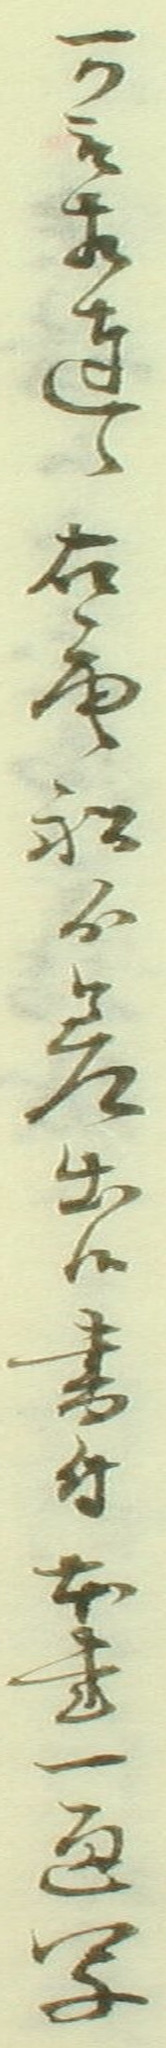可被相達候右唐船ゟ差出候書付本書一通写
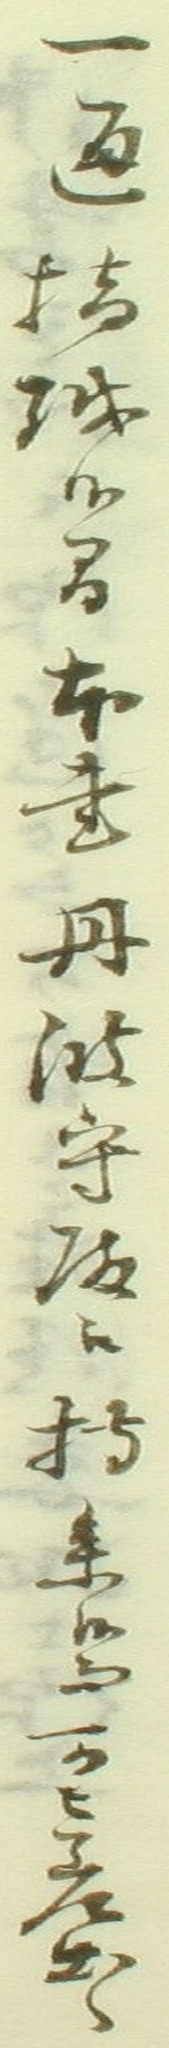一通指越候間本書丹波守殿え持参候而可被差出候
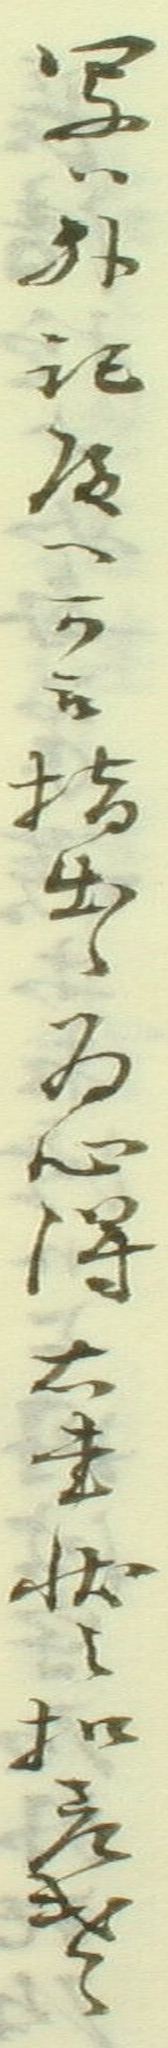写は外記殿へ可被指出候為心得右書状之扣差遣候
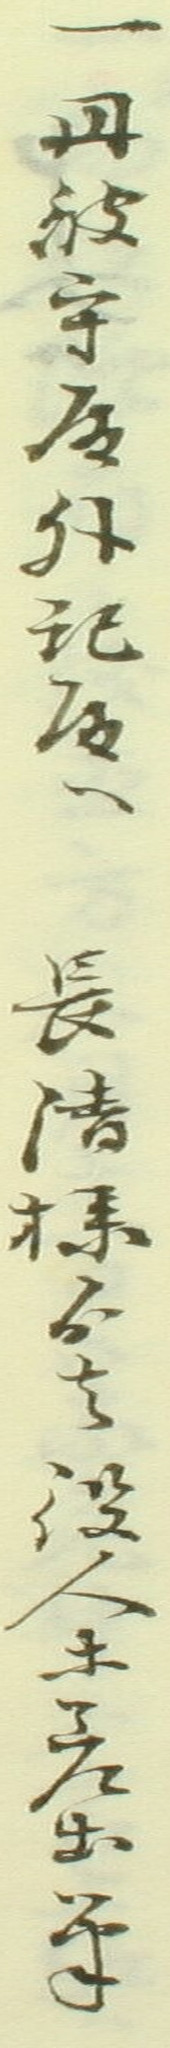一丹波守殿外記殿へ長清様ゟ其役人等差出筆
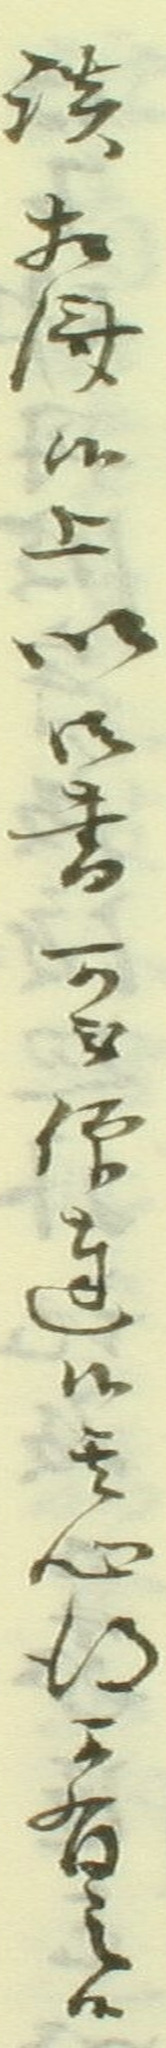談相済候上御口書可被仰達候其心得可有之候
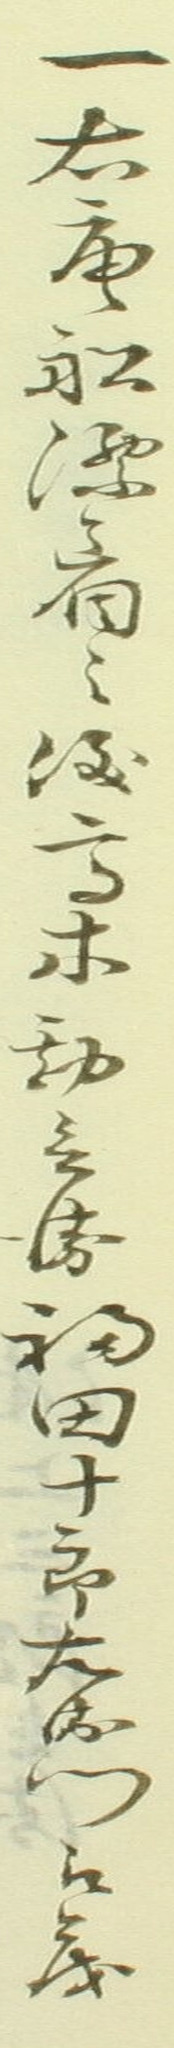一右唐船漂着之儀高木勘兵衛福田十郎右衛門え茂
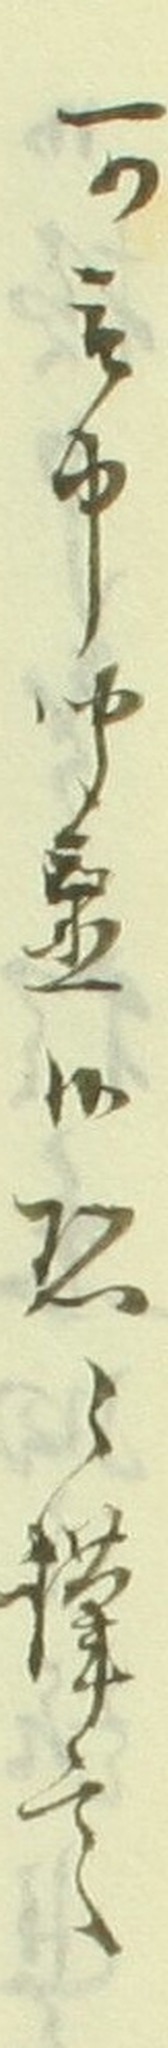可被申聞置候恐々謹言
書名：異国船漂着記
